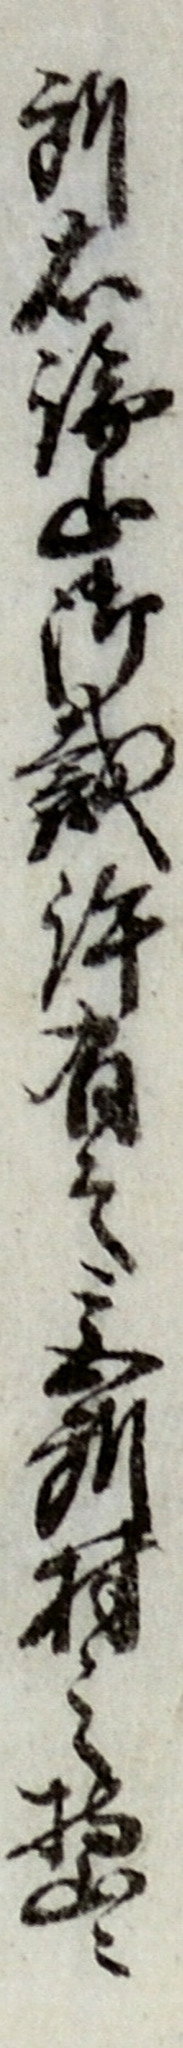所右論山御裁許有之宮所村之持山ニ
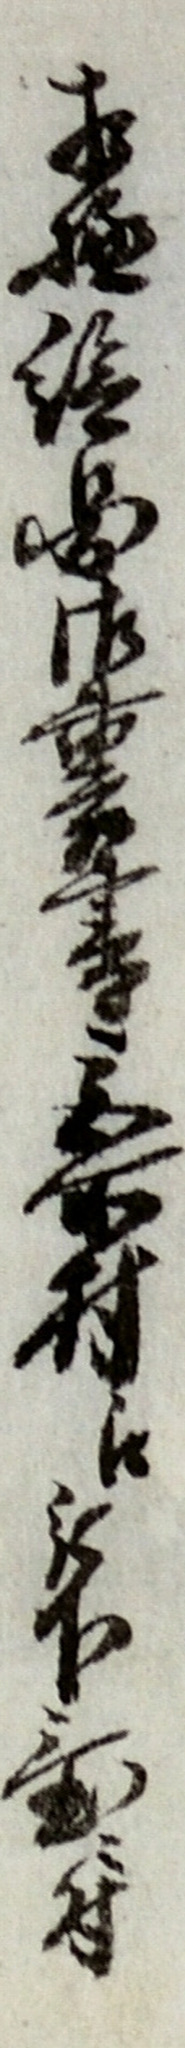相極絵図御裏書宮所村え被下置ニ付
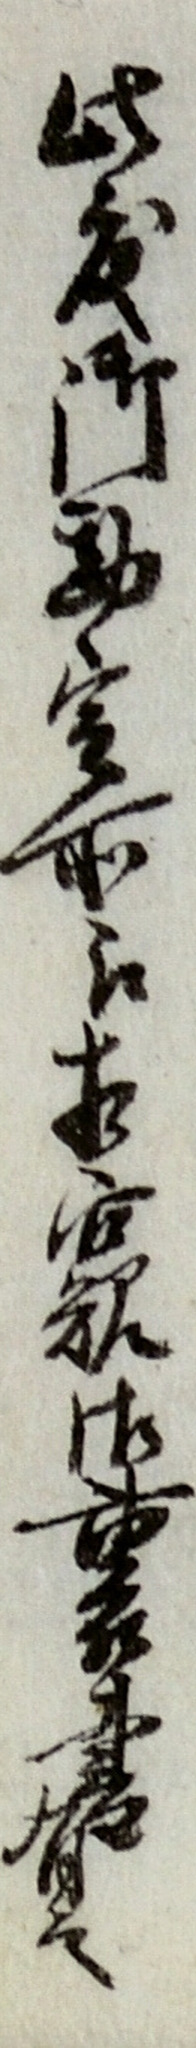此度御勘定所え相窺御裏書有之
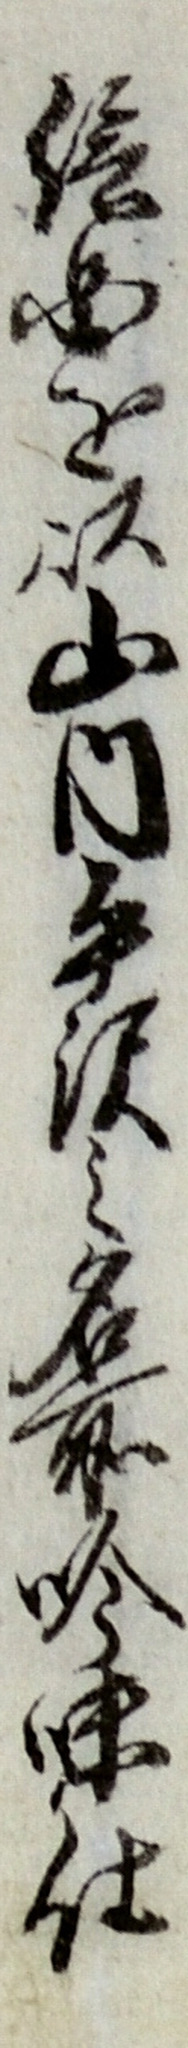絵図を以山内平沢之名所吟味仕
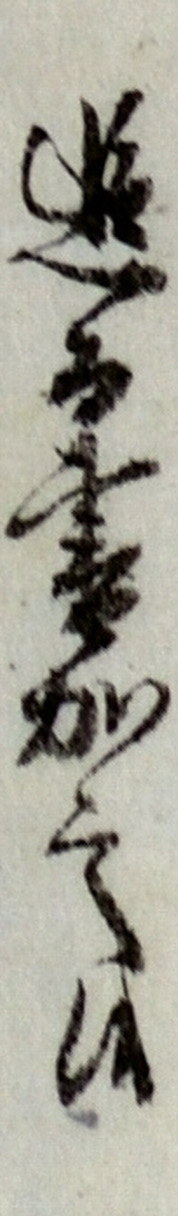追而書加之候

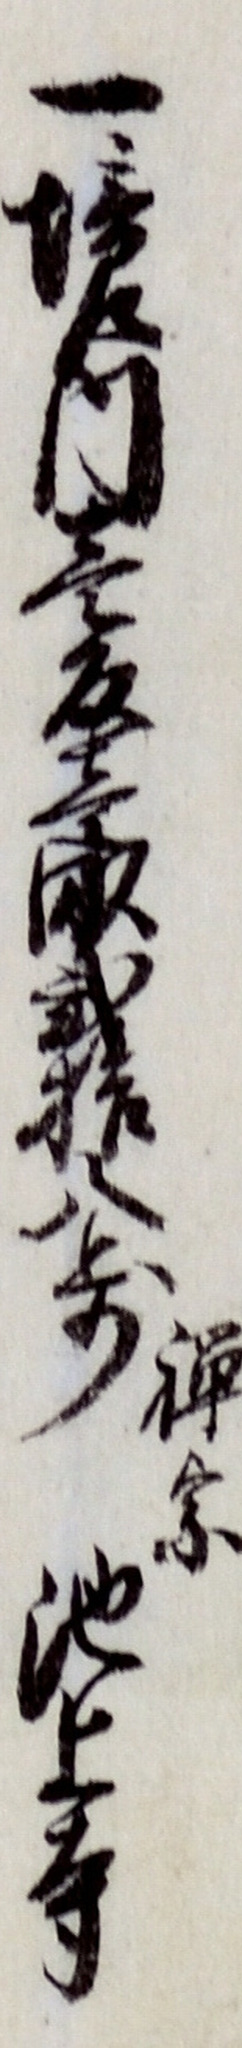一境内壱反壱畝弐拾八歩池上寺
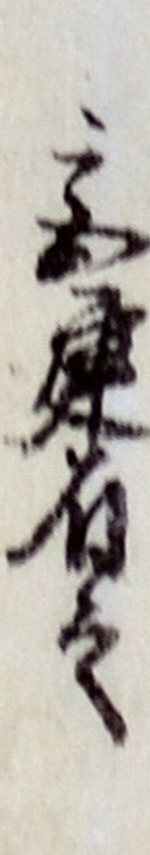宮建有之
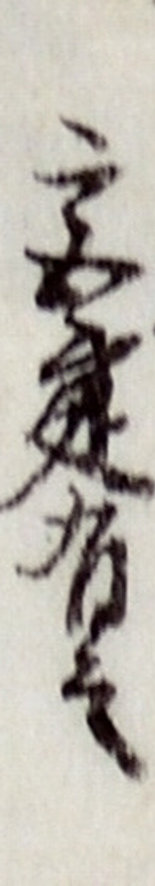宮建有之
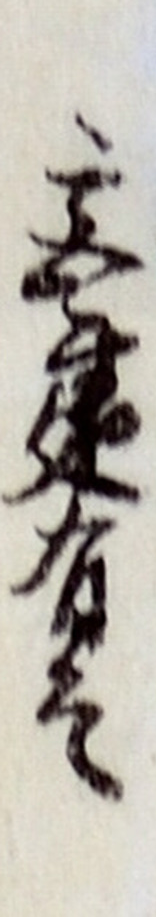宮建有之
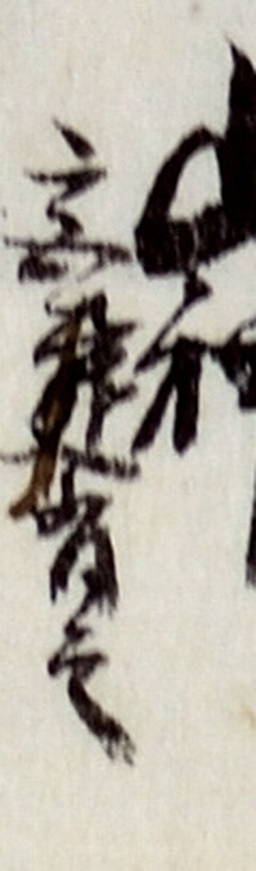宮建有之
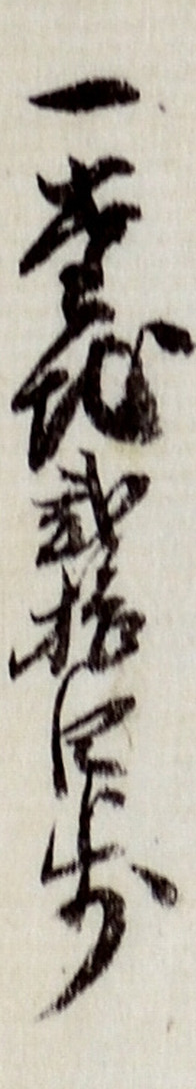堂地弐拾四歩
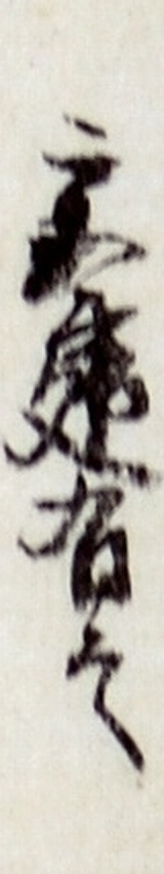宮建有之
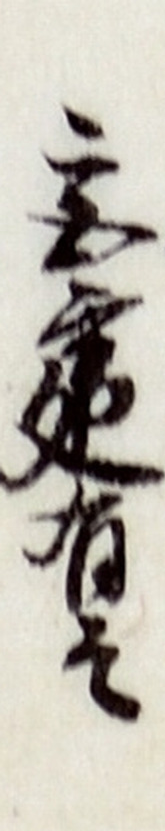宮建有之
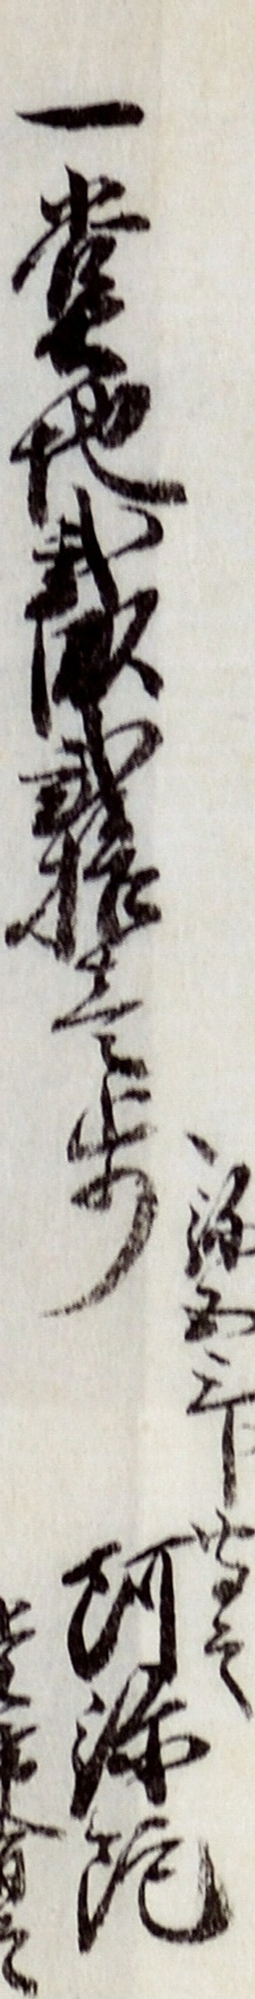一堂地弐畝弐拾壱歩阿弥陀
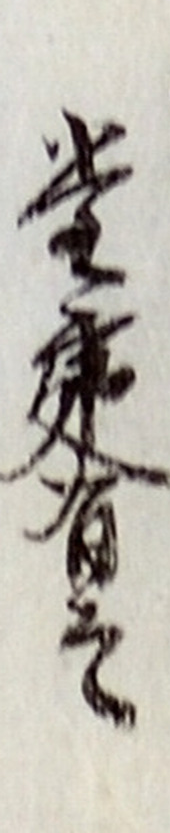宮建有之
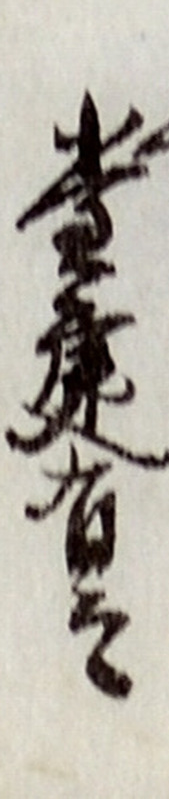堂建有之
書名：御領分中山林社地手控
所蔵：伊那市立高遠町図書館・合同会社AMANE
